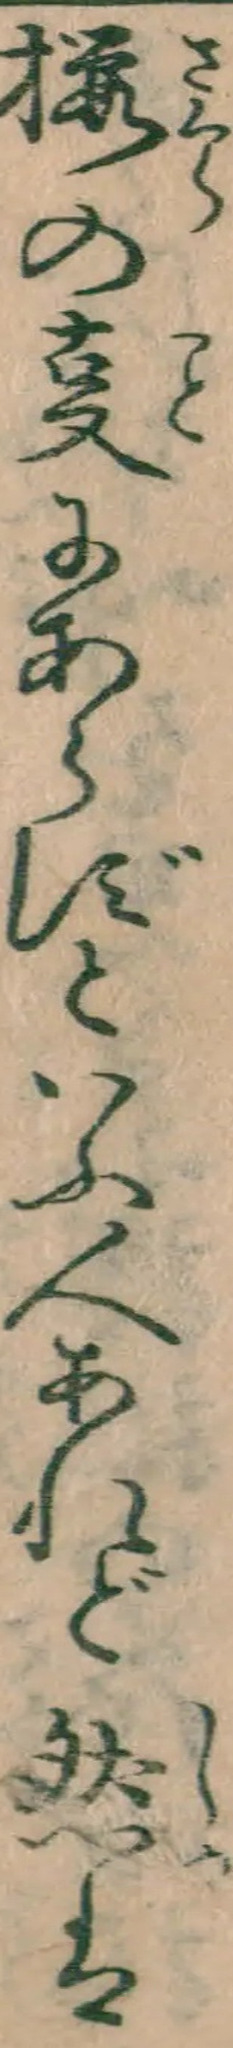桜の事にあらずといふ人あれど然は

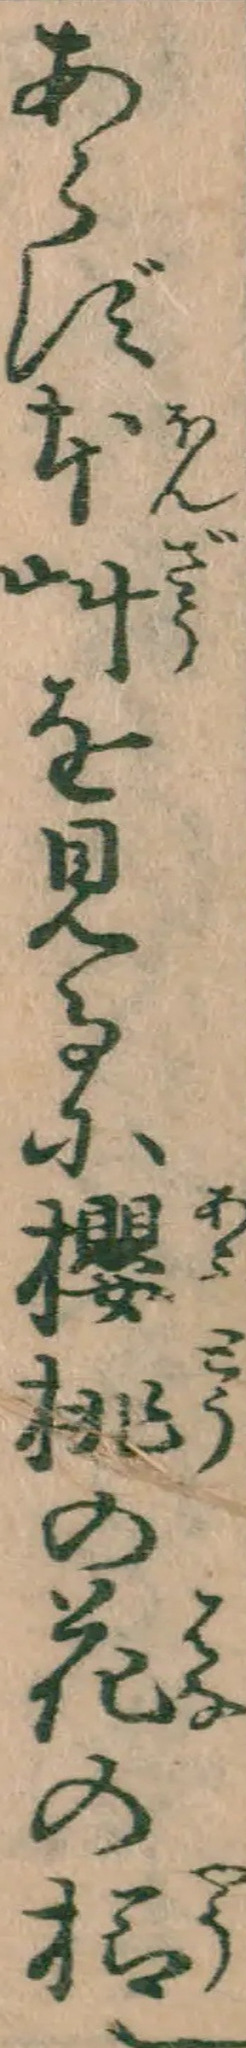あらず本草を見るに桜桃の花の様
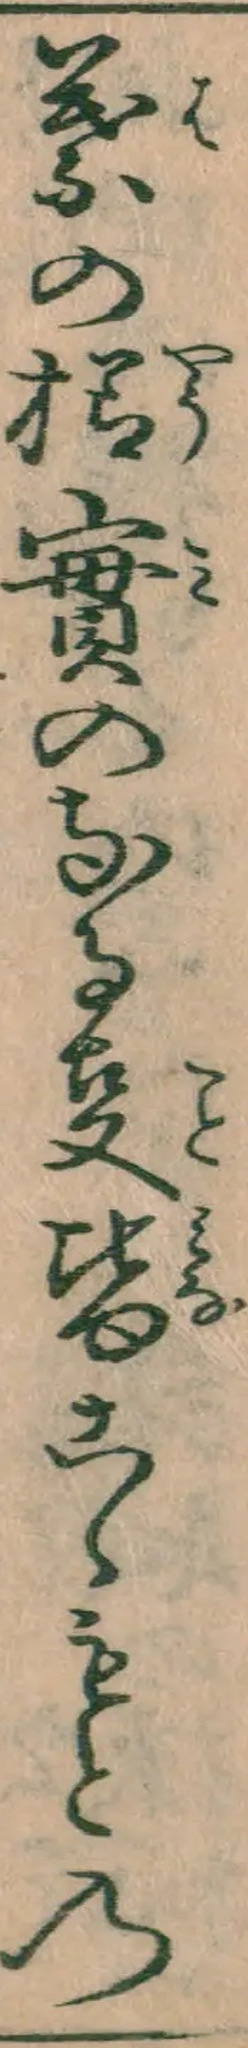葉の様実のなる事皆こゝもとの
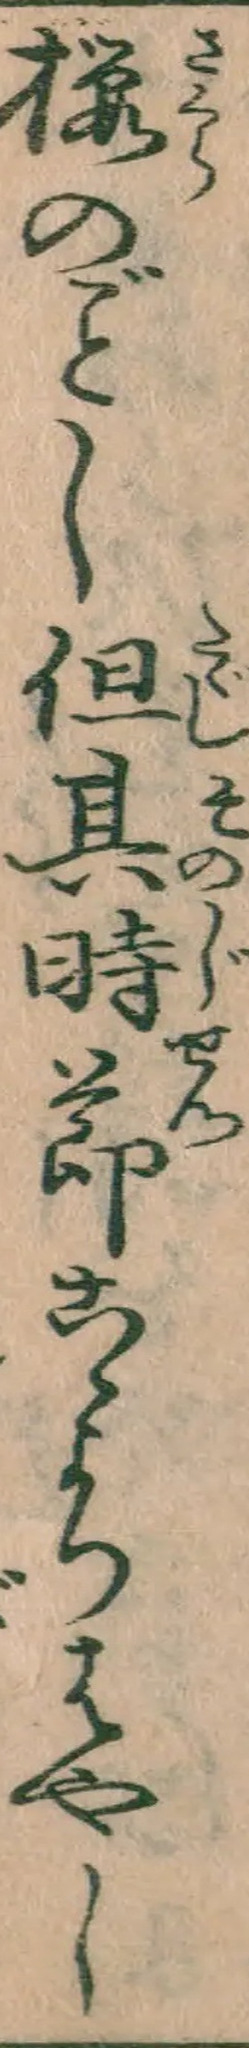桜のごとし但其時節こゝよりはやし
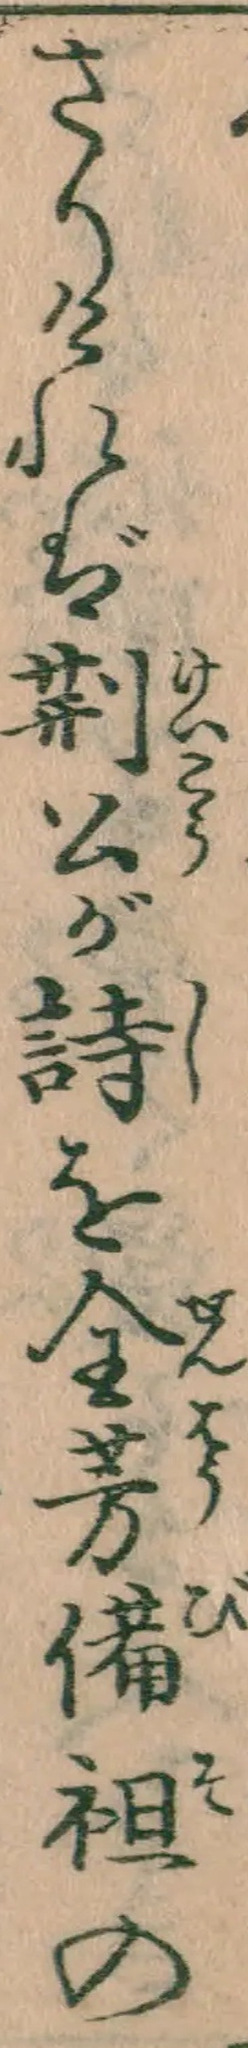さりければ荊公が詩を全芳備祖の
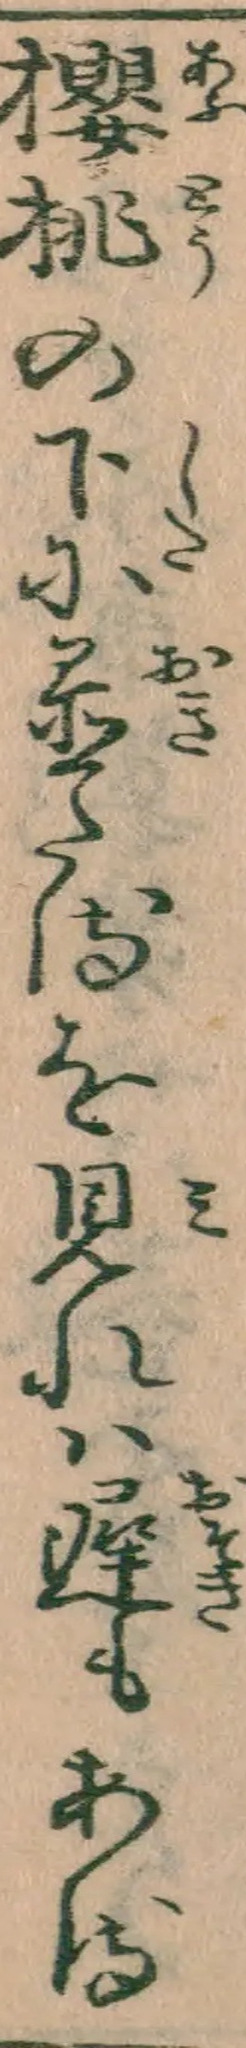桜桃の下に置たるを見れは遅もある
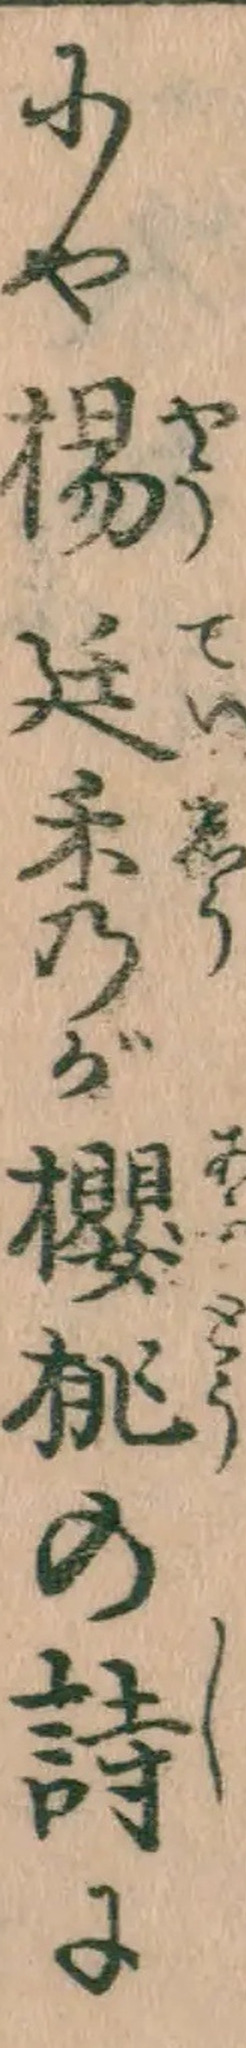にや楊廷秀が桜桃の詩に
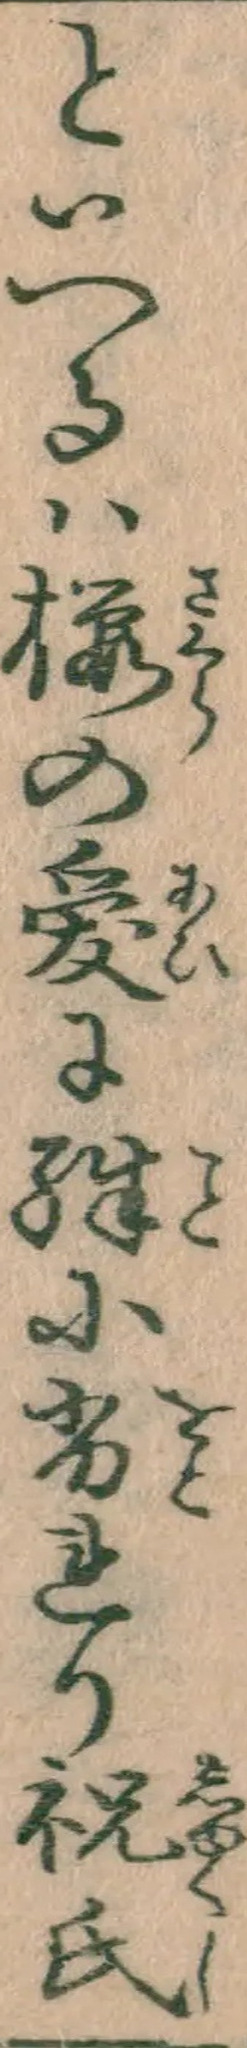といへるは桜の愛に殊に劣れり祝氏
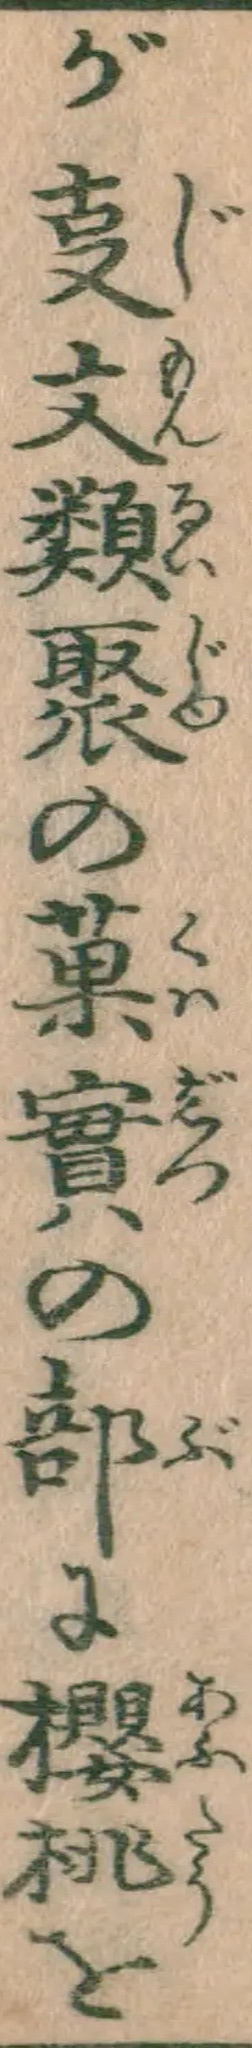が事文類聚の菓実の部に桜桃を
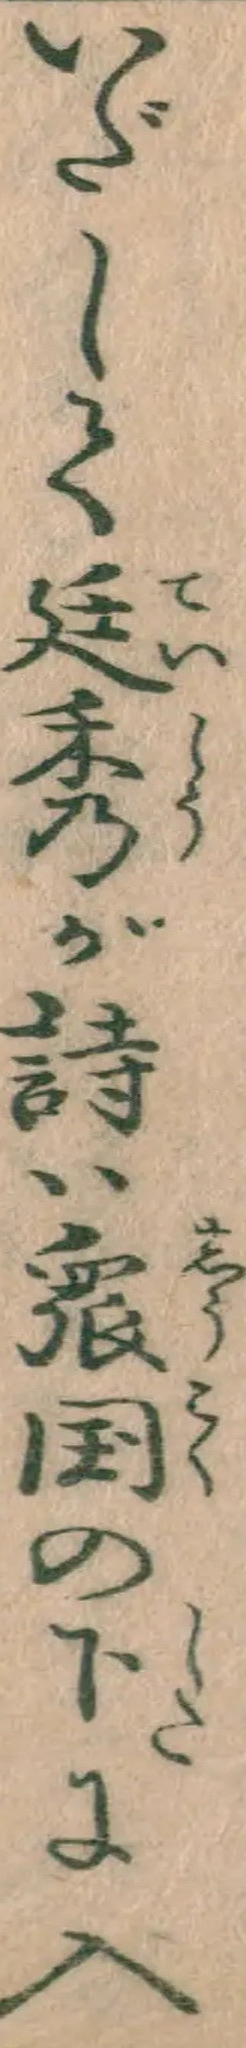いだして廷秀が詩は衆国の下に入
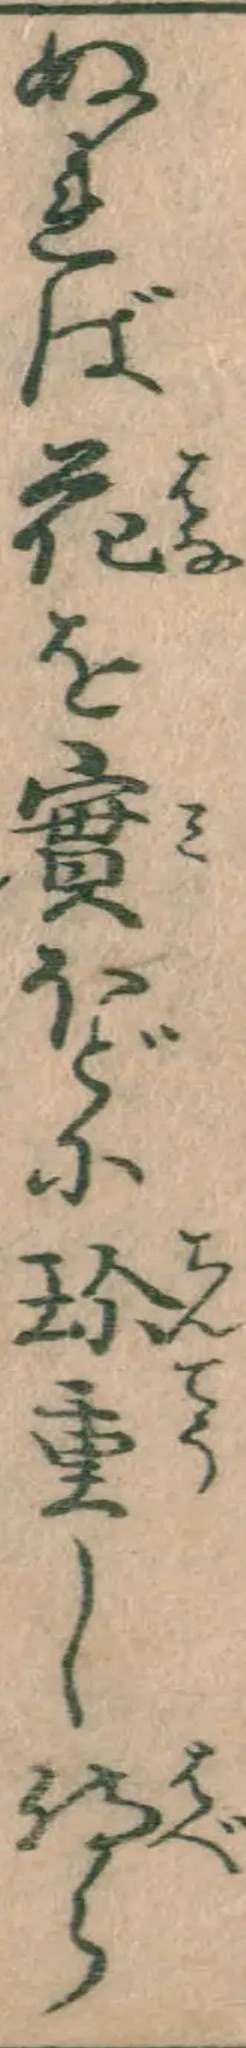ぬれば花を実ほどに珍重し侍ら
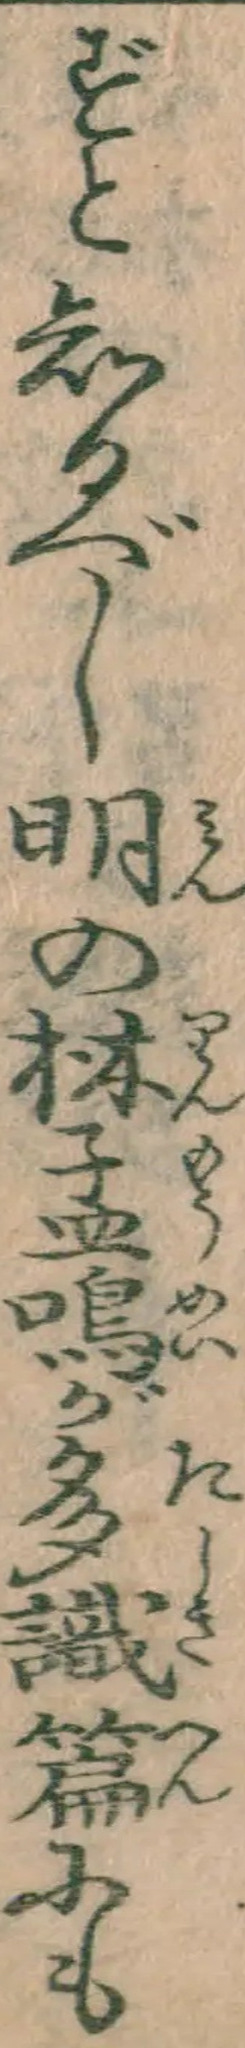ずと知るべし明の林孟鳴が多識篇にも

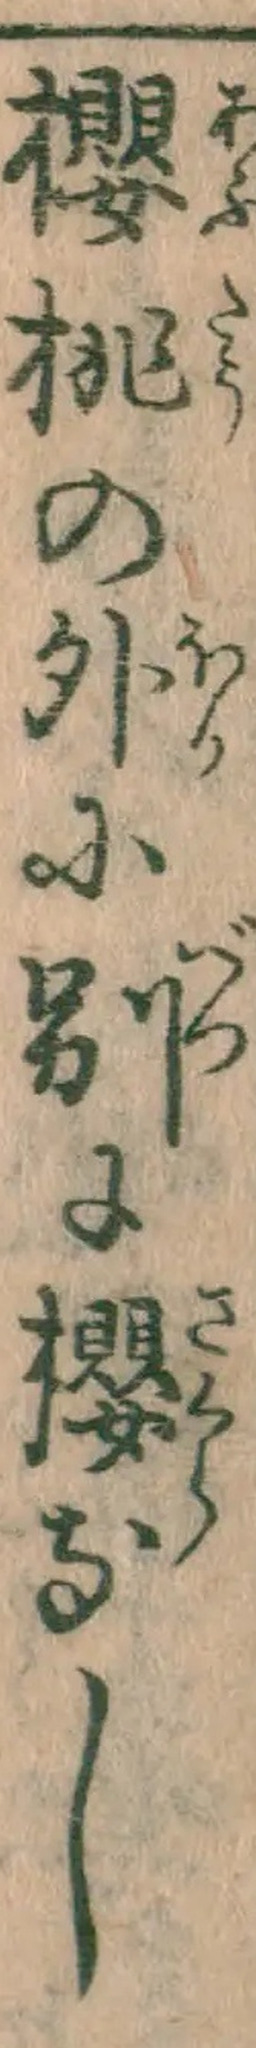桜桃の外に別に桜なし
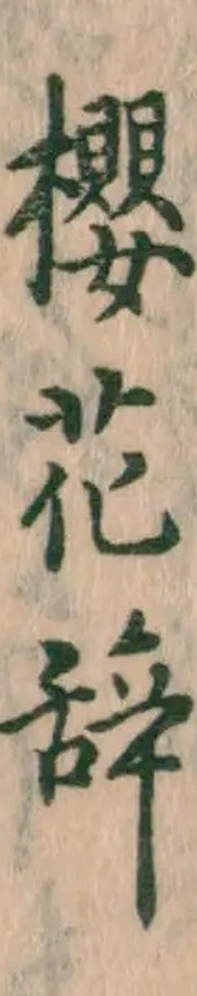桜花辞
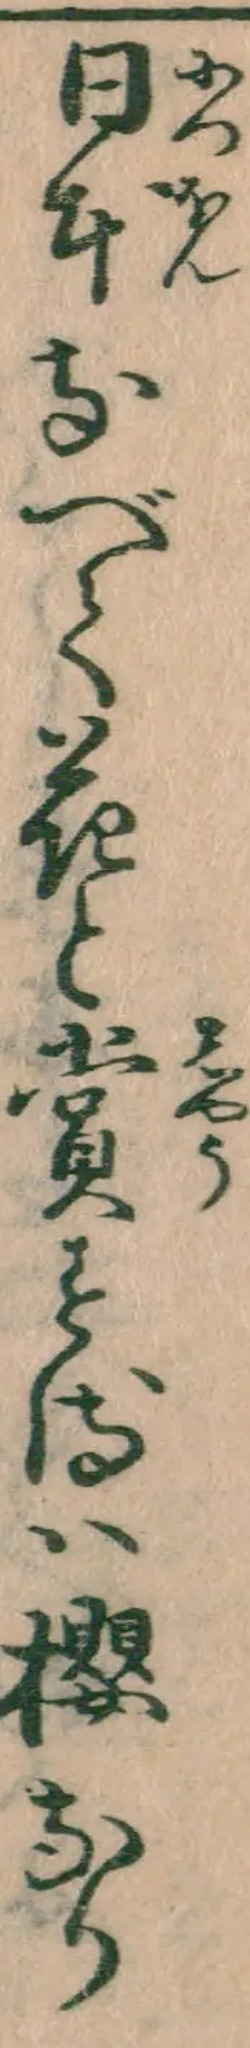日本なべて花と賞するは桜なり
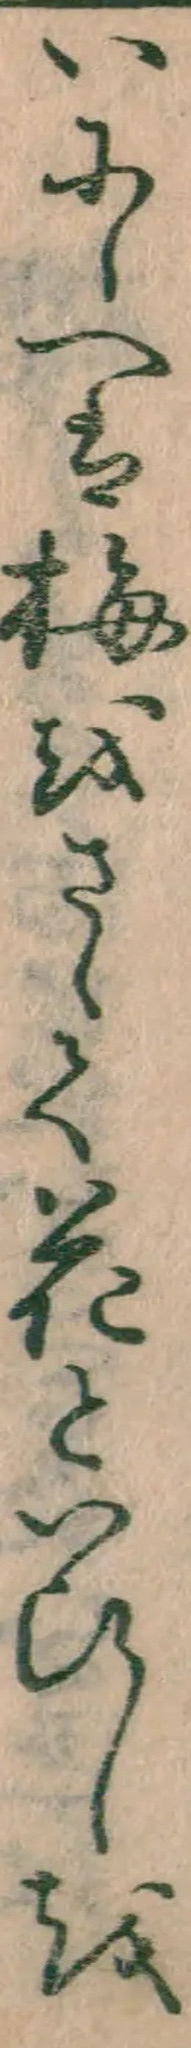いにしへは梅をさして花といひしを
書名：怡顔齋櫻品
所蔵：国立国会図書館 National Diet Library, JAPAN
